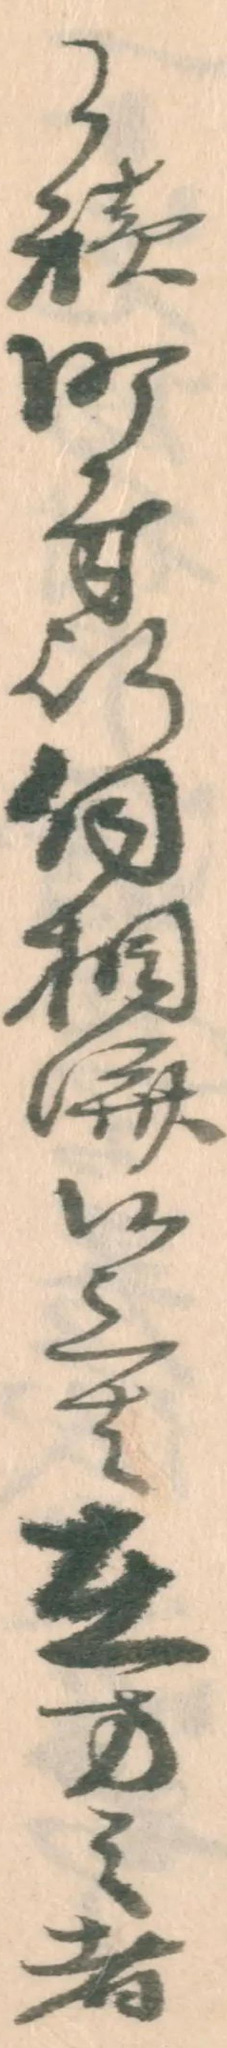候積町奉行伺相済候上は在方之者
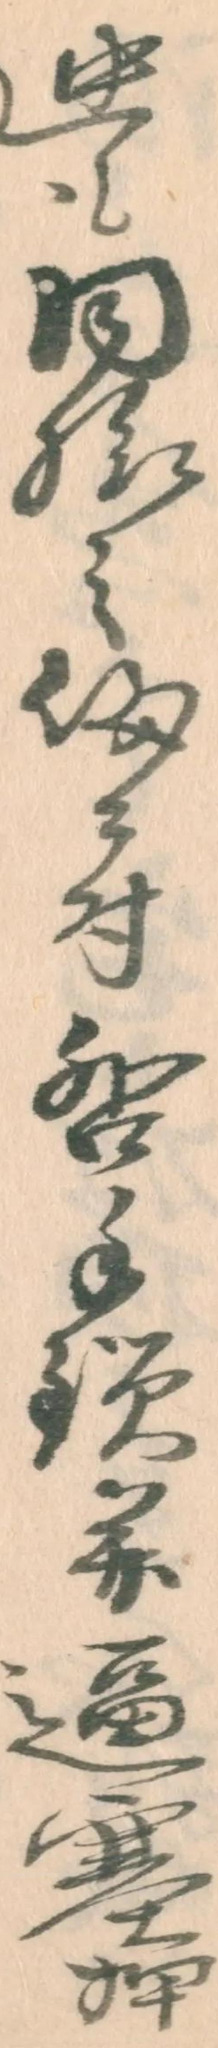迚も同様之儀ニ付咎手鎖幷逼塞押
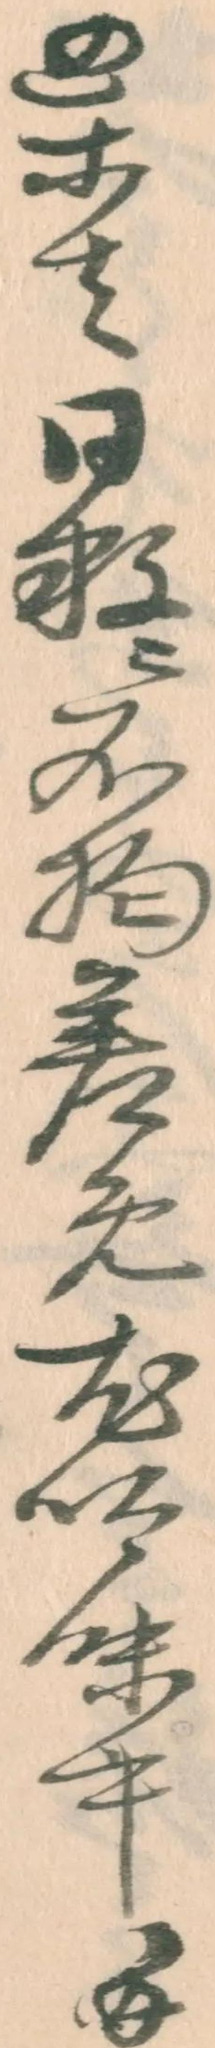込等は日数ニ不拘差免尤吟味中手
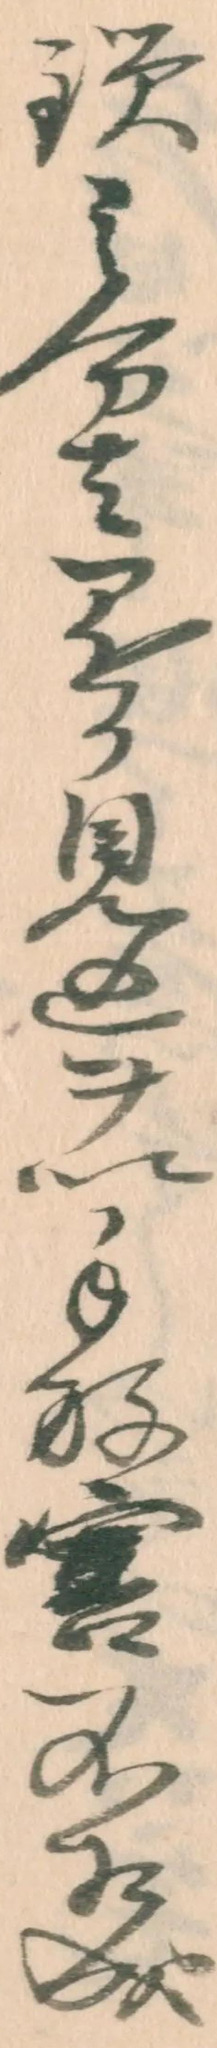鎖之分は懸り見込ヲ以手放害不相成
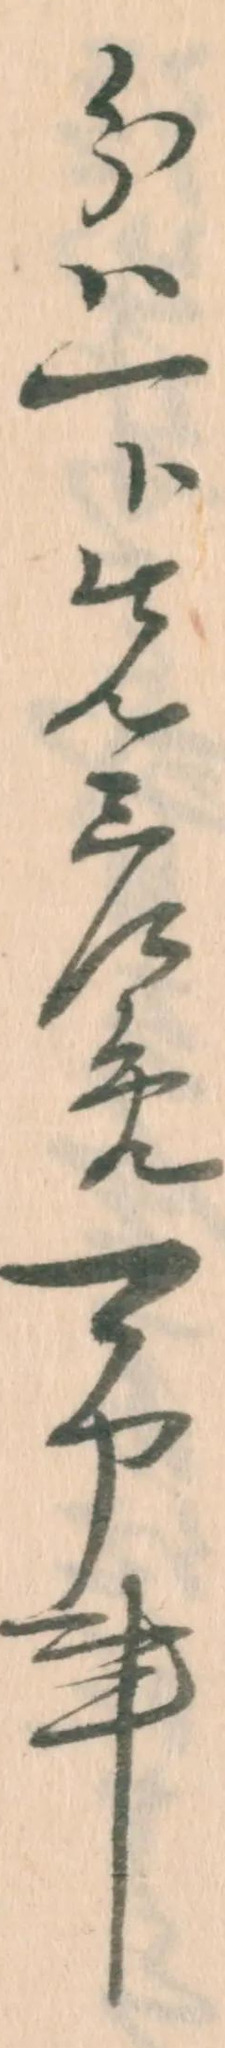分ハ一ト先差免可申事
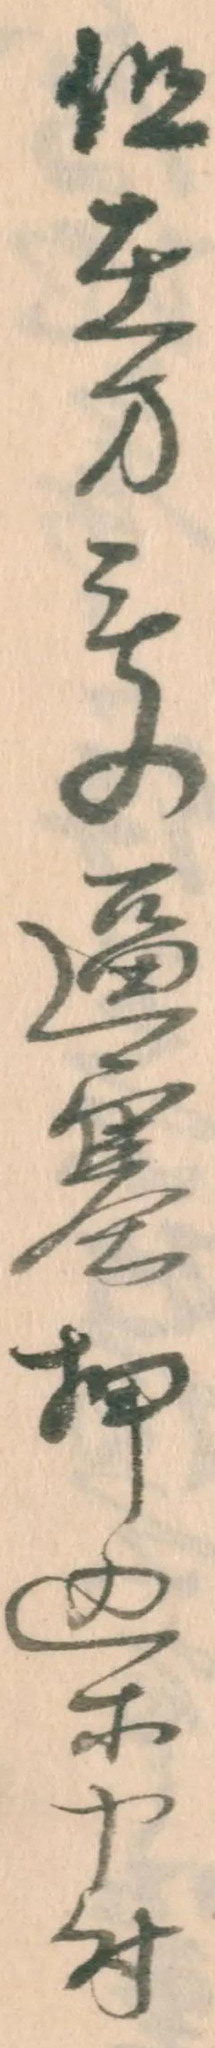但在方もの逼塞押込等申付
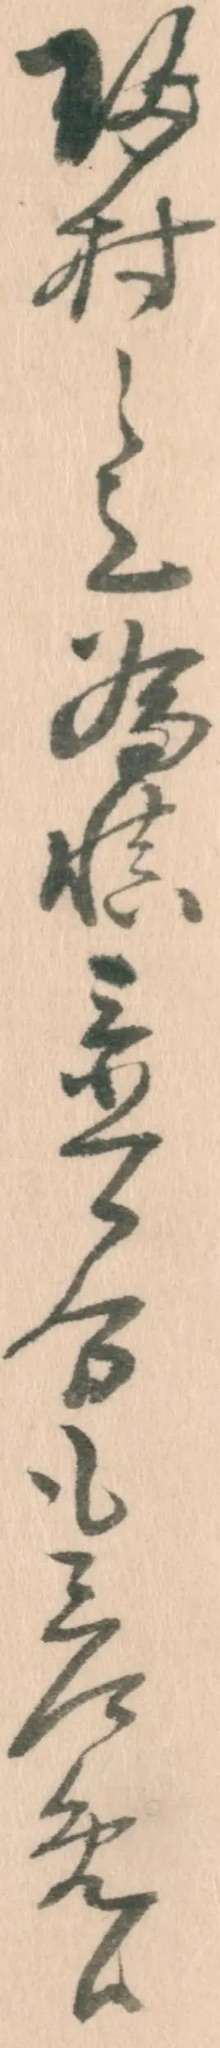帰村之上為慎置候分も差免候
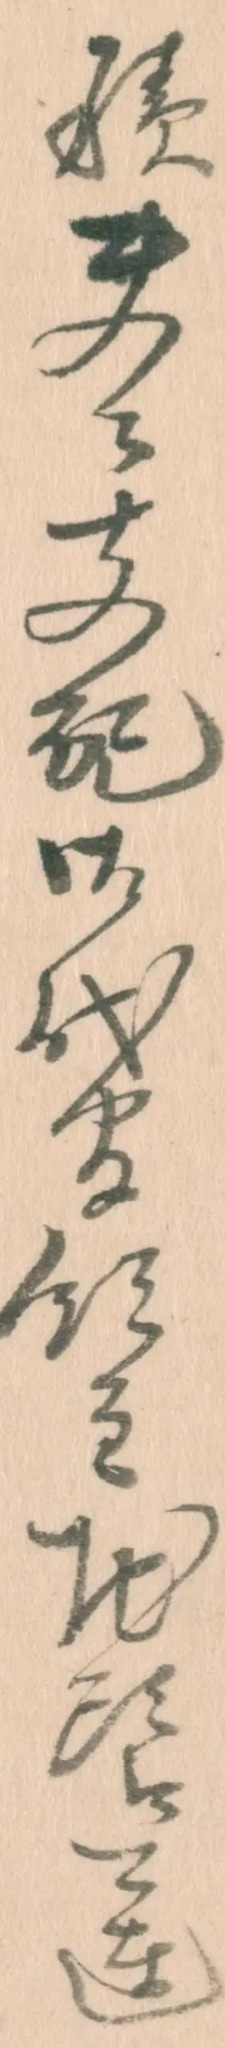積夫〻支配御代官領主地頭え可達
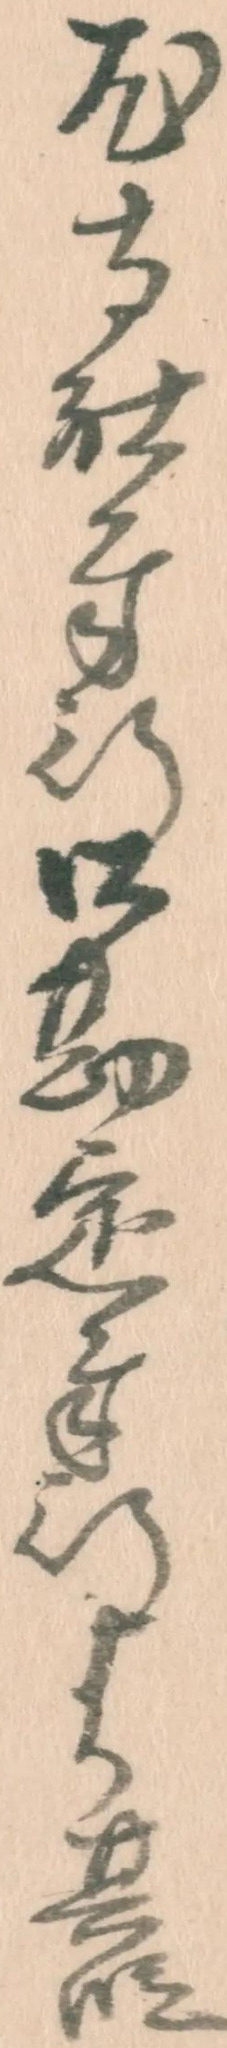尤寺社奉行御勘定奉行より其段
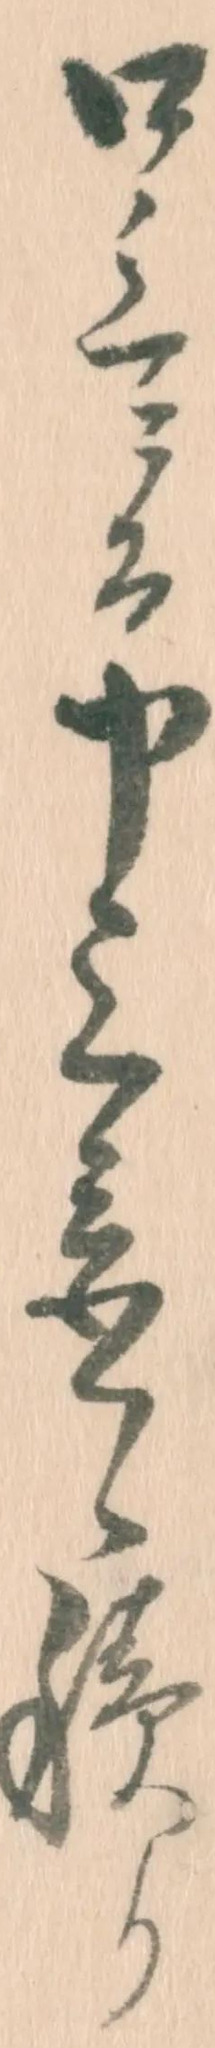口上ニて申上参候積り
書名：地震災書留 2巻. [2] 内表紙に「地震一件　安政二卯年十月」とあり
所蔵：国立国会図書館 National Diet Library, JAPAN
